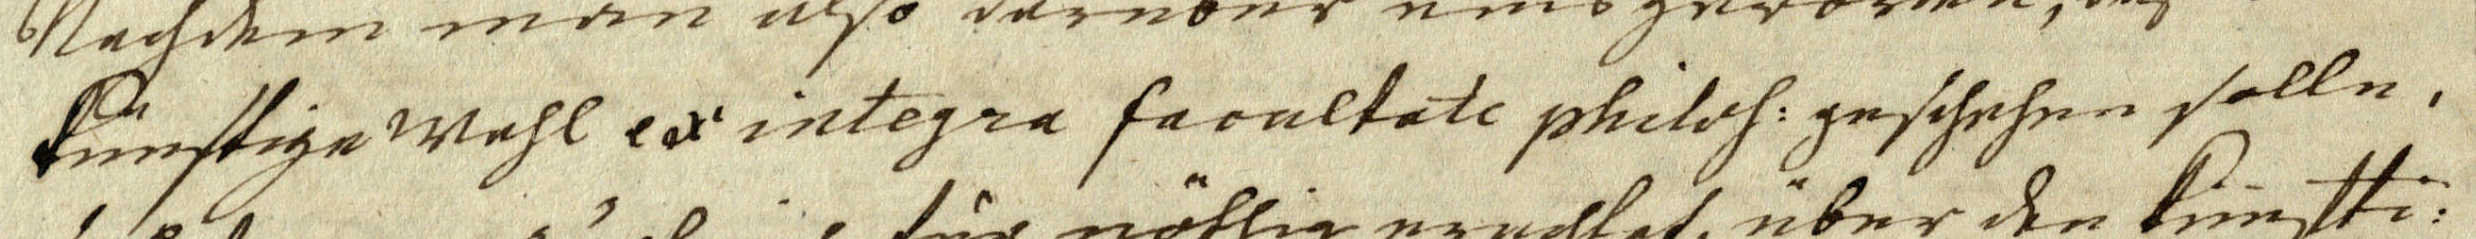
künftige Wahl ex integra facultate philos. geschehen solle,
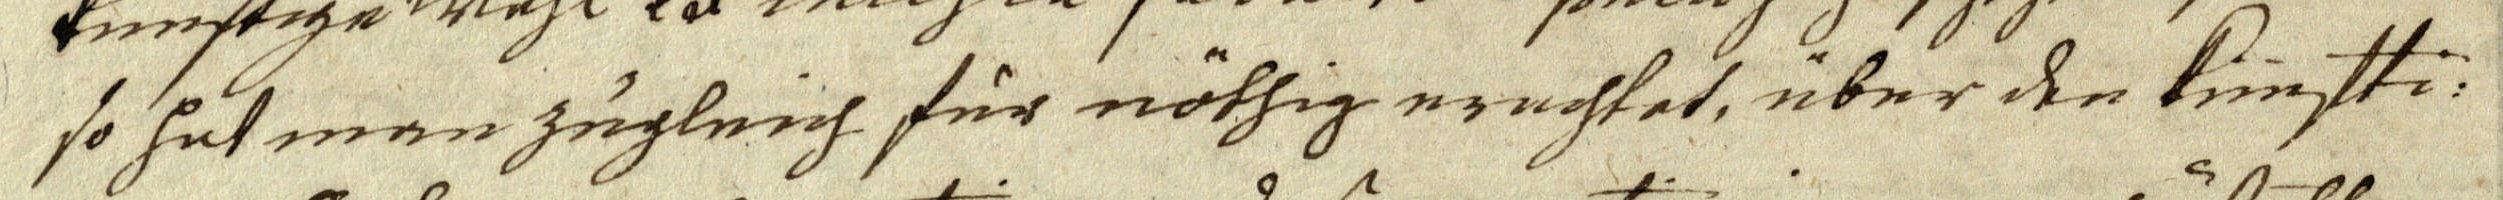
so hat man zugleich für nöthig erachtet, über den künfti¬
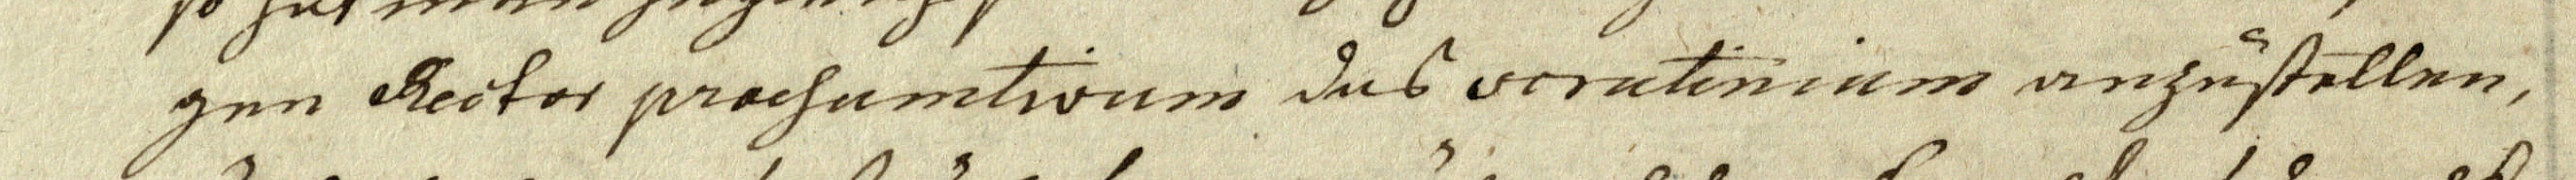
gen Rector praesumtivum das scrutinium anzustellen,
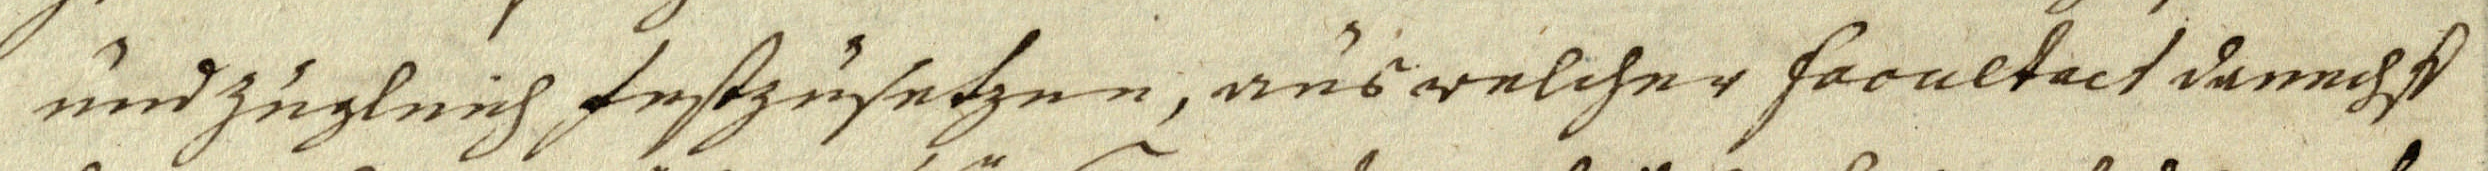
und zugleich festzusetzen, aus welcher Facultaet danechst
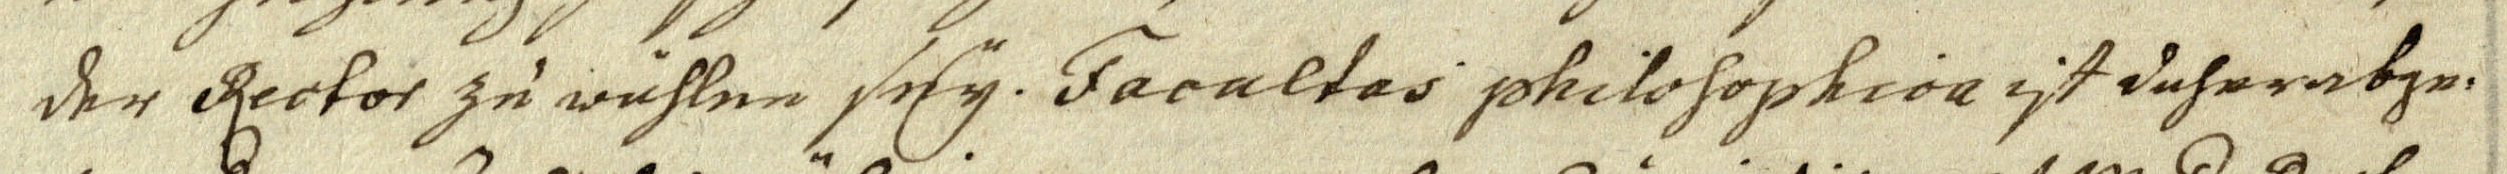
der Rector zu wählen seÿ. Facultas philosophica ist daher abge¬
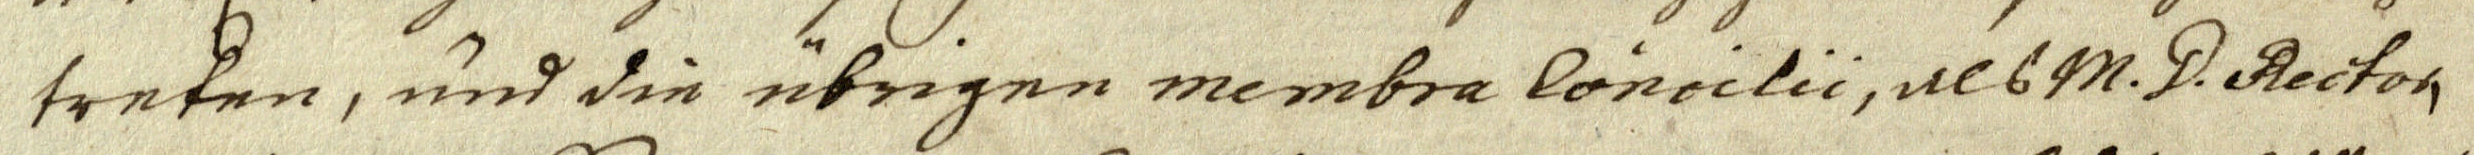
treten, und die übrigen membra Concilii, als M. D. Rector
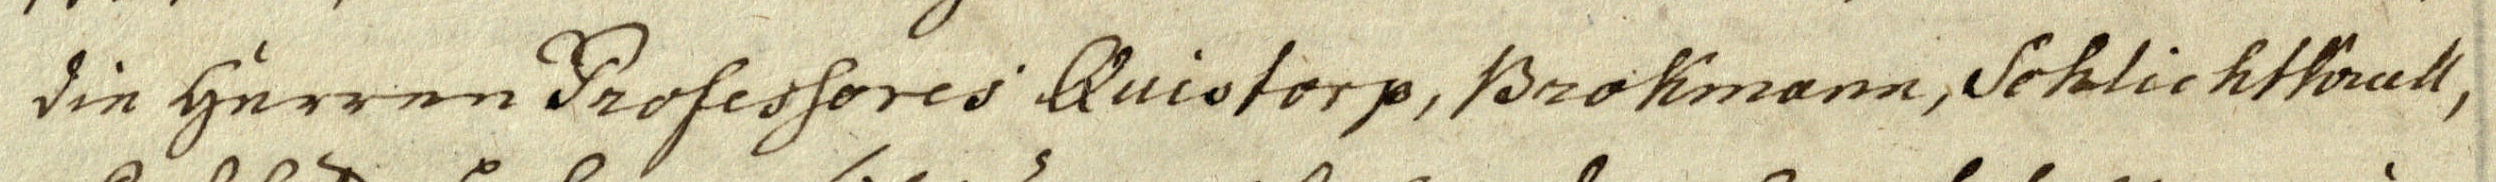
die Herren Professores Quistorp, Brokmann, Schlichtkrull,
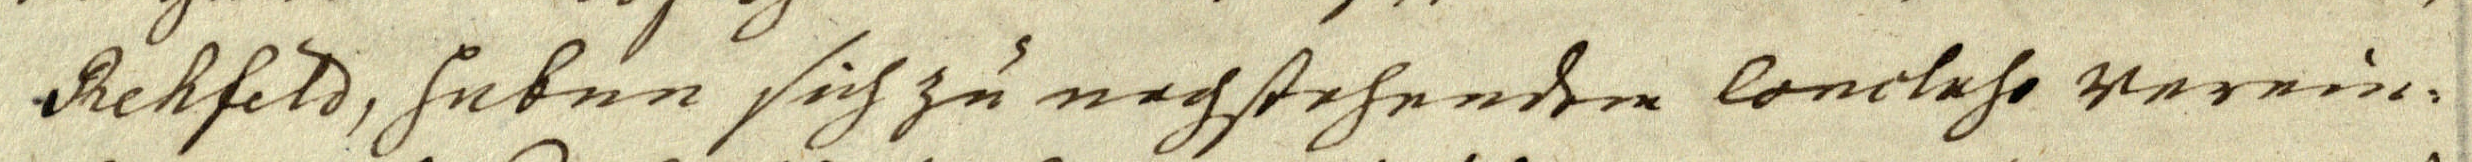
Rehfeld haben sich zu nachstehendem Concluso verein¬
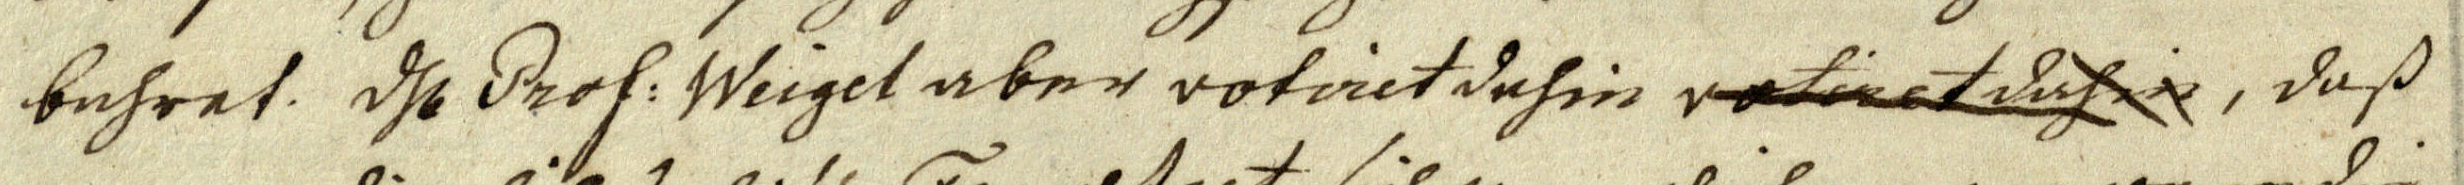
bahret. dh. Prof. Weigel aber votiret dahin votiret dahin , daß
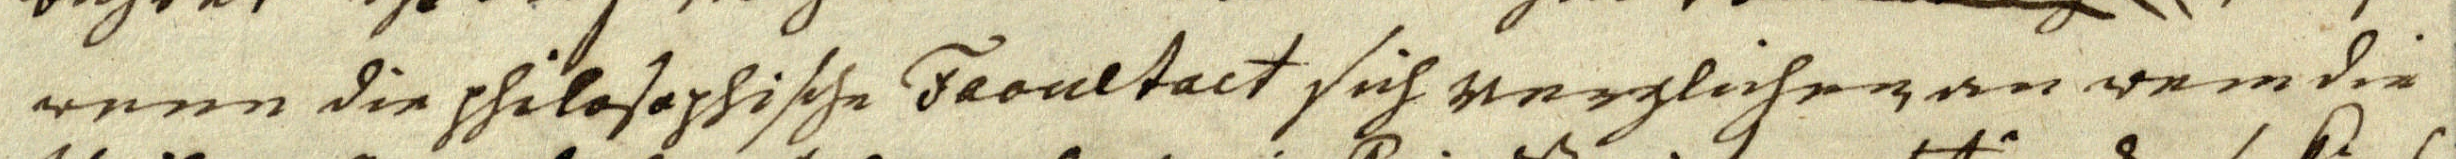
wenn die philosophische Facultaet sich verglichen an wem die
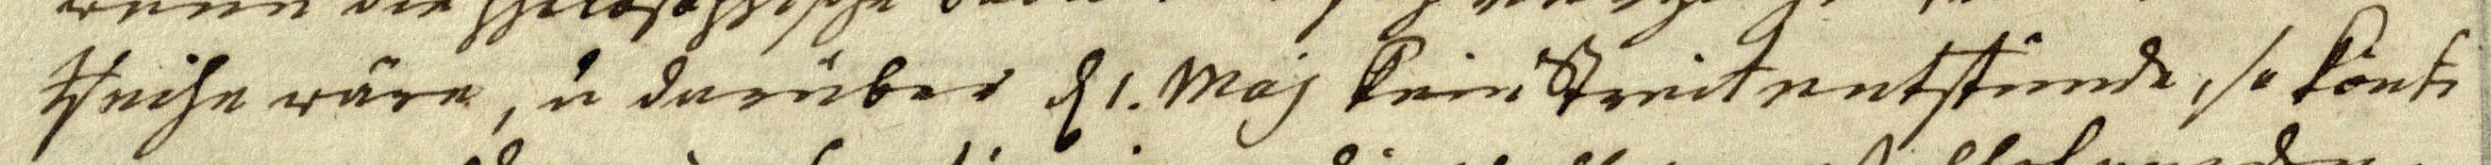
Reihe wäre, u darüber d. 1. Maj kein Streit entstünde, so könte
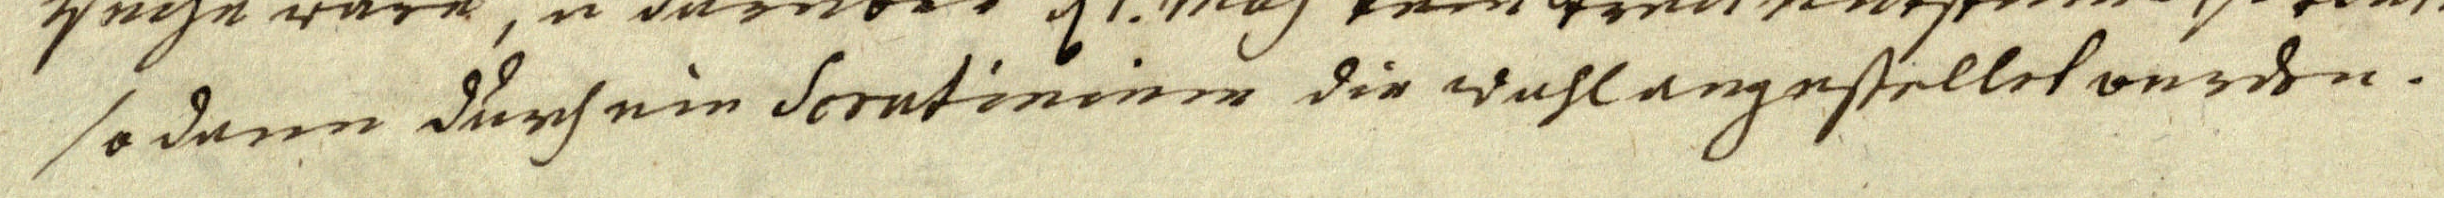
sodann durch ein Scrutinium die Wahl angestellet werden.
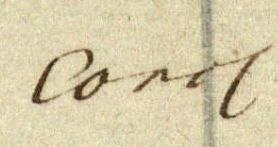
Concl
